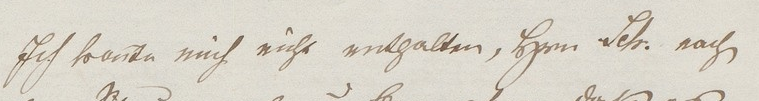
Ich konnte mich nicht enthalten, Hrn. Sch. nach
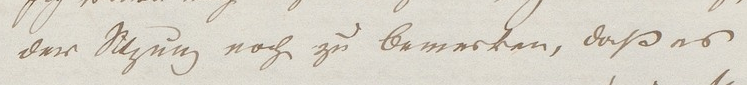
der Sitzung noch zu bemerken, daß es
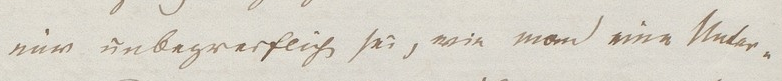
mir unbegreiflich sei, wie man eine Unter-
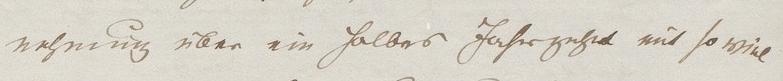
nehmung über ein halbes Jahrzehnt mit so viel
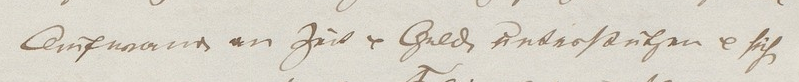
Aufwand an Zeit & Geld unterstützen & sich
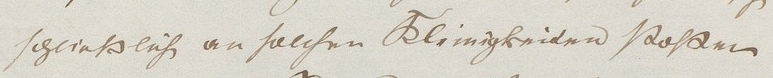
schließlich an solchen Kleinigkeiten stoßen
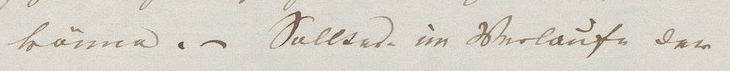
könne. – Sollten im Verlaufe der
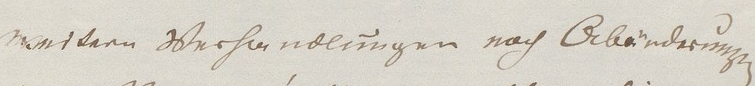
weitern Verhandlungen noch Abänderungen
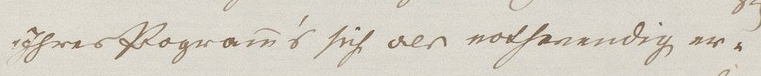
Ihres Programm's sich als nothwendig er-
